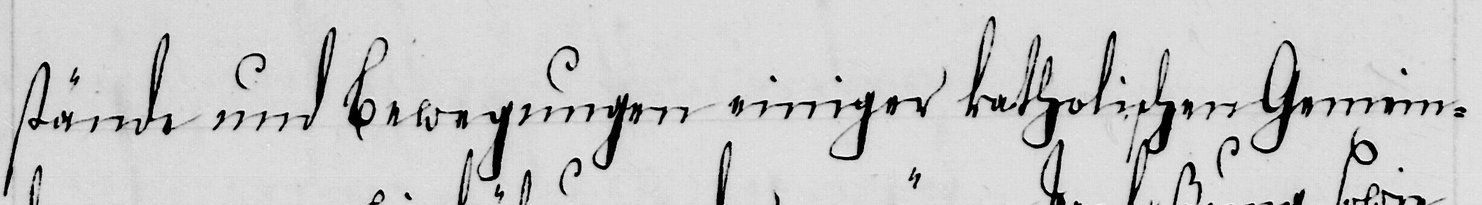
stände und Bewegungen einiger katholischer Gemein¬
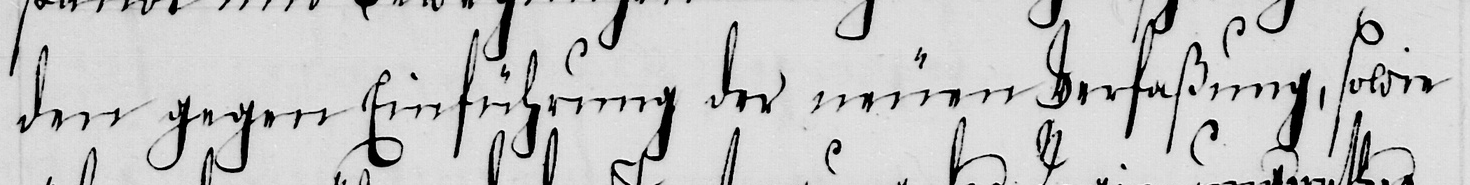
den gegen Einführung der neuen Verfaßung, sowie
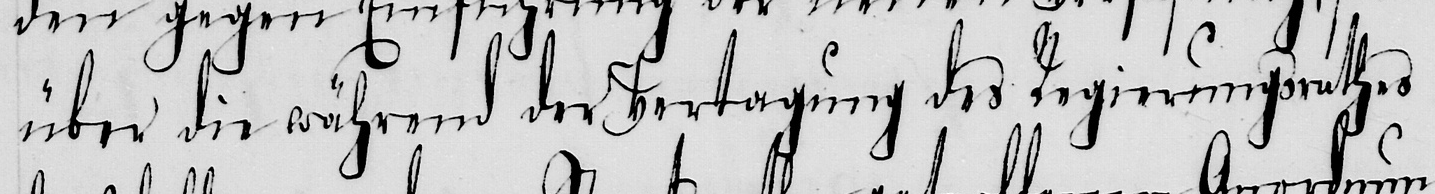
über die während der Vertagung des Regierungsrathes
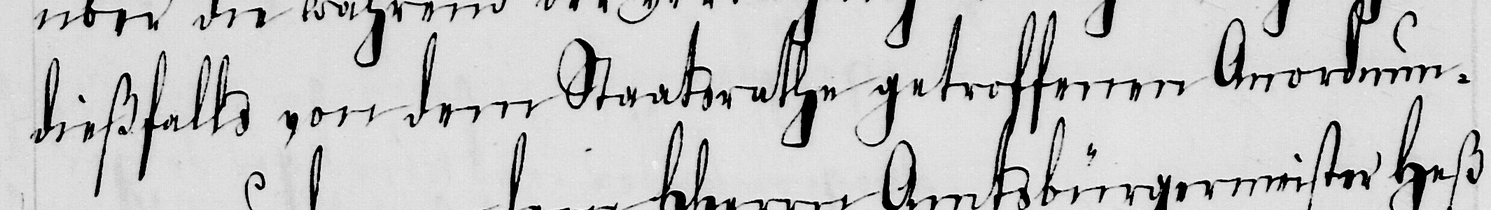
dießfalls von dem Staatsrathe getroffenen Anordnun¬
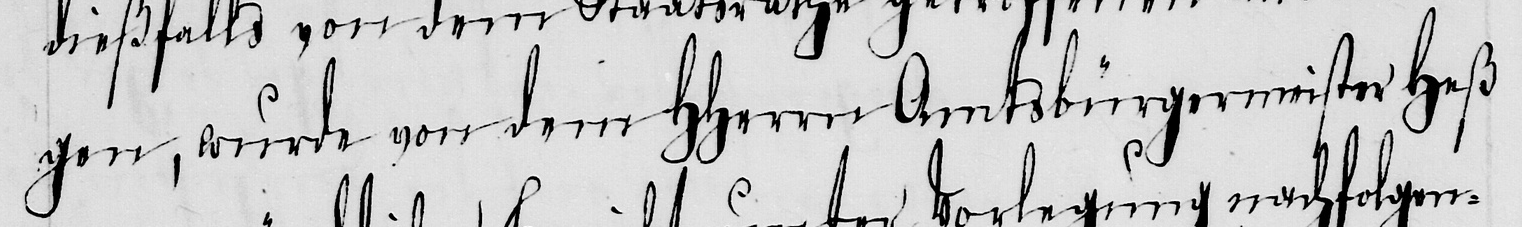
gen, wurde von dem HHerrn Amtsbürgermeister Heß
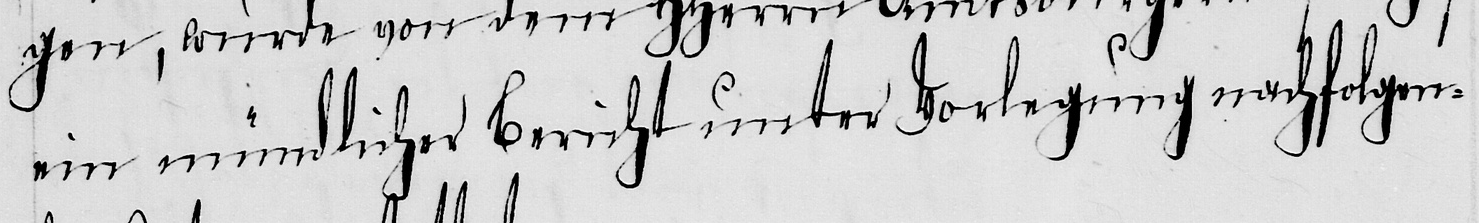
ein mündlicher Bericht unter Vorlegung nachfolgen¬
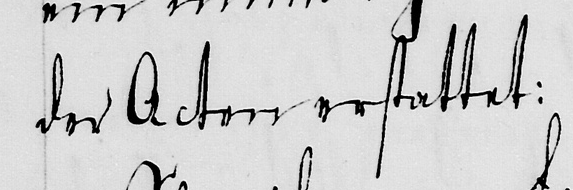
der Acten erstattet:
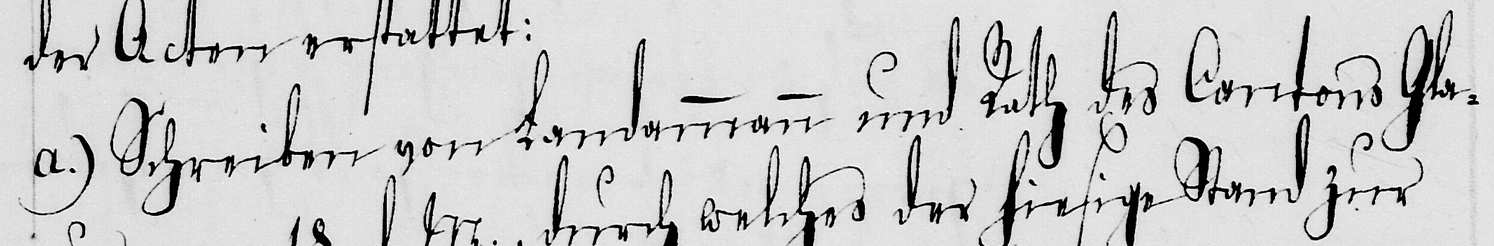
a.) Schreiben von Landammann und Rath des Cantons Gla¬
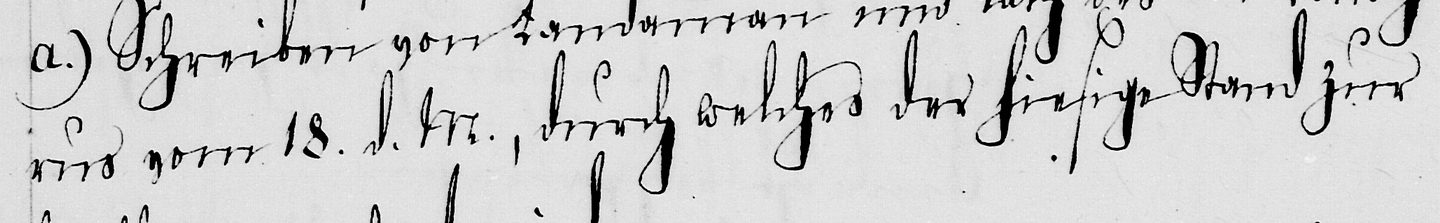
rus vom 18. d. M., durch welches der hiesige Stand zur
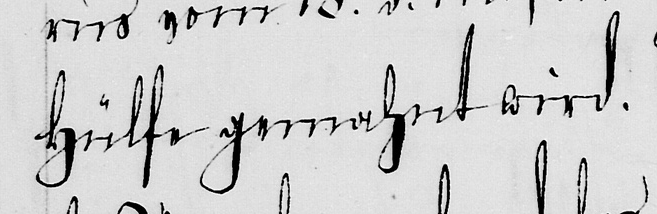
Hülfe gemahnt wird.
